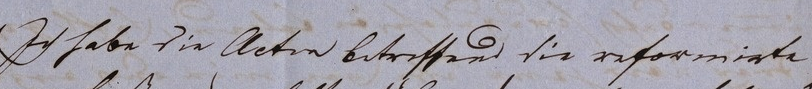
Ich habe die Acten betreffend die reformirte
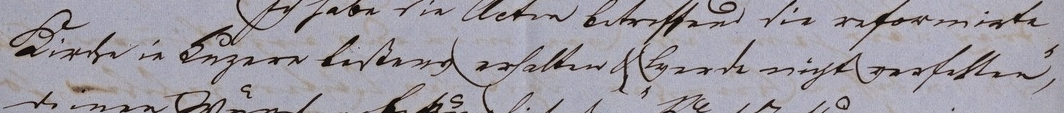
Kirche in Luzern bestens erhalten & «werde nicht verfehlen»,
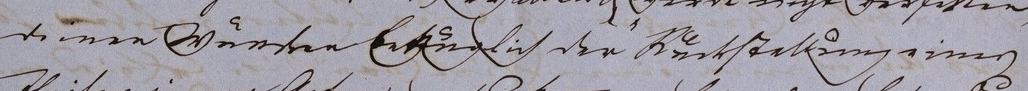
deinen Wünschen bezüglich der Rückstellung eines
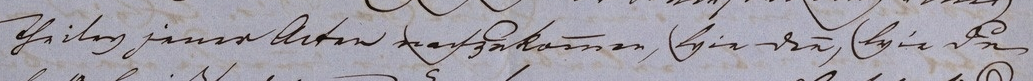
Theiles jener Acten nachzukommen, wie denn, wie Du
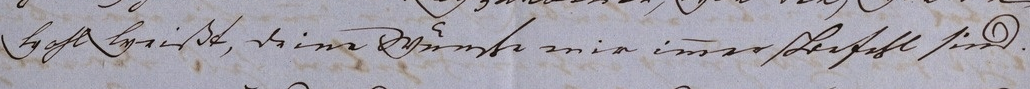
wohl weißt, Deine Wünsche mir immer Befehl sind.
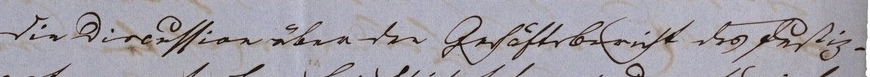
Die Discussion über den Geschäftsbericht des Justiz-
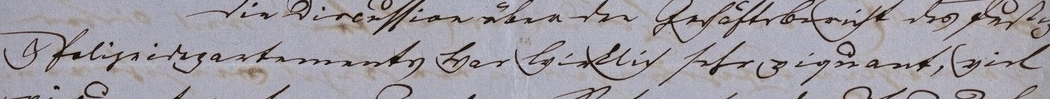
& Polizeidepartements war wirklich sehr piquant, viel
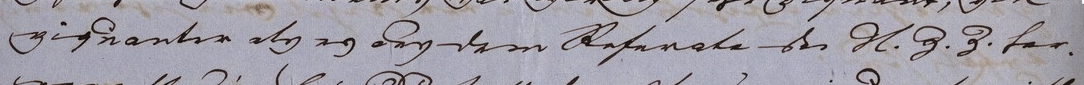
piquanter als es aus dem Referate der N.Z.Z. her-
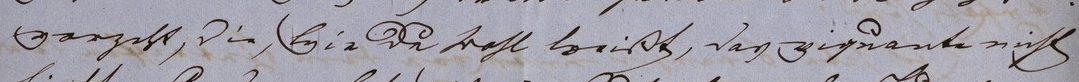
vorgeht, die, wie Du wohl weißt, das piquante nicht
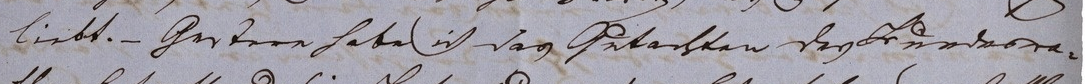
liebt. – Gestern habe ich das Gutachten des Bundesra-
